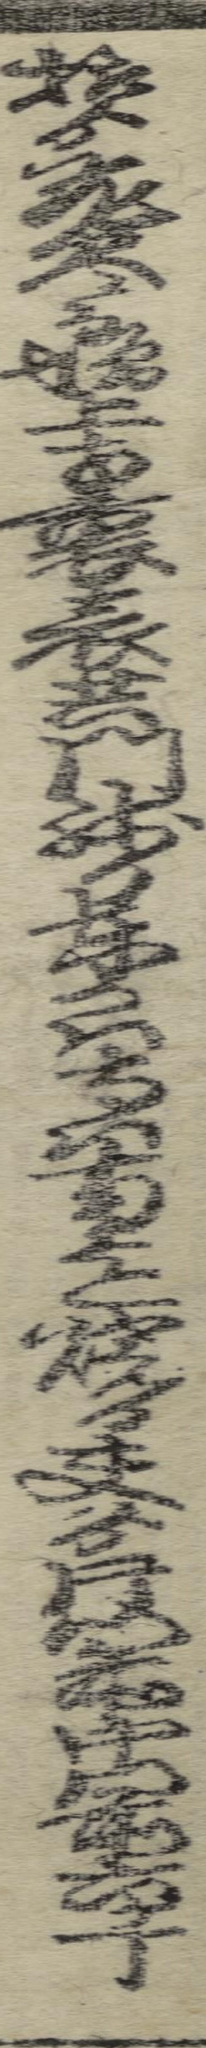様ゟ飛火にて増上寺裏表共門残り東かは寺は南迄焼る其ゟ片門前中門前六ヶ丁
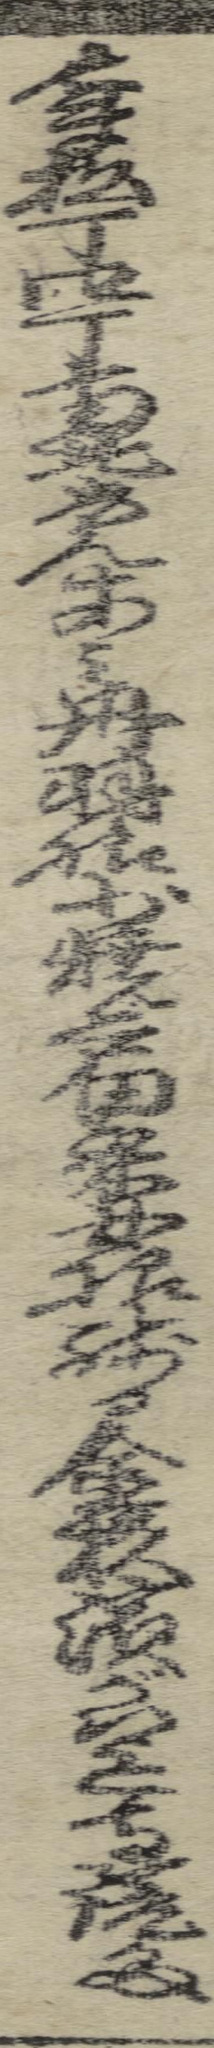はま松丁四丁南北しんあみ丹羽様少焼戸田采女様残る金杉浜がは迄寺院多
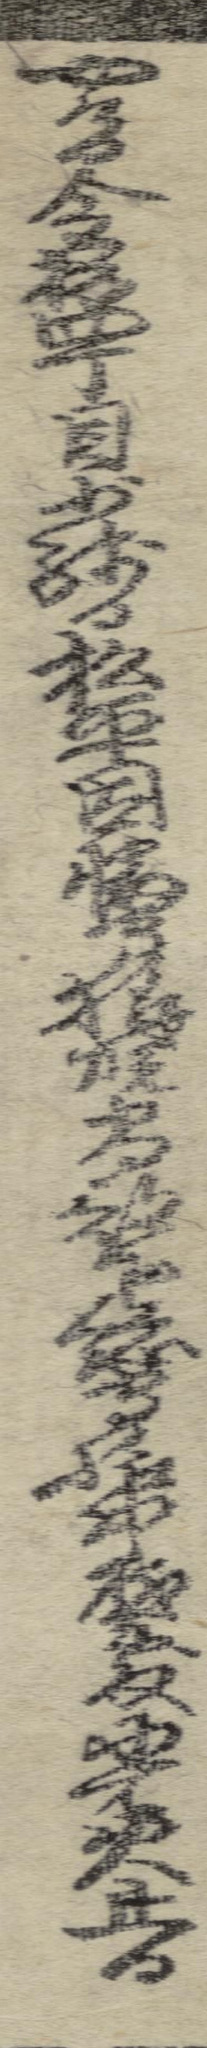やける金杉四丁目少残る松平因幡守様焼間部下総守様中屋敷にて火止る
